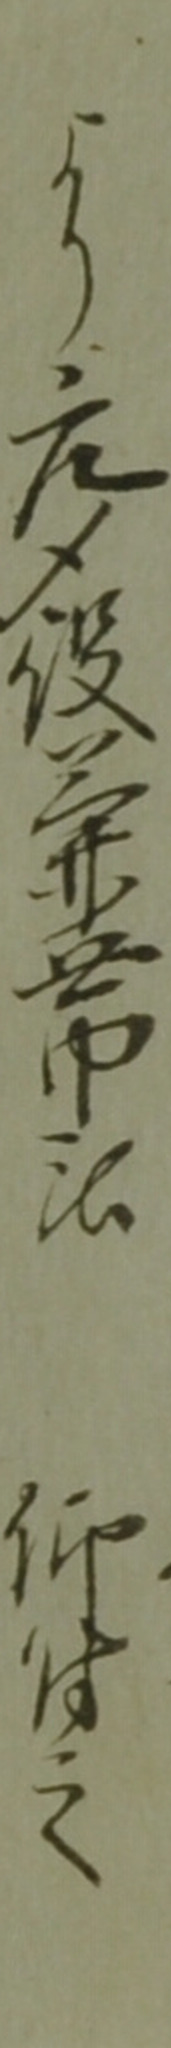より元〆役兼帯被仰付之
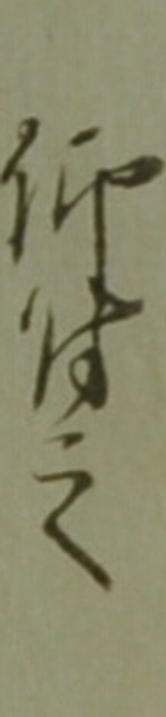仰付之
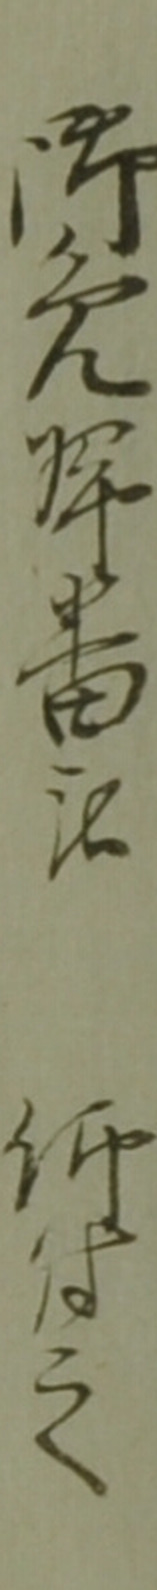御免帰番被仰付之
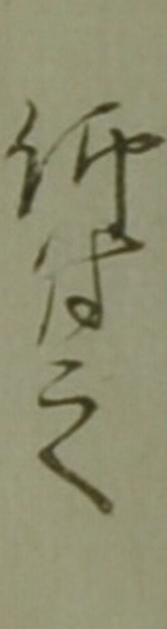仰付之

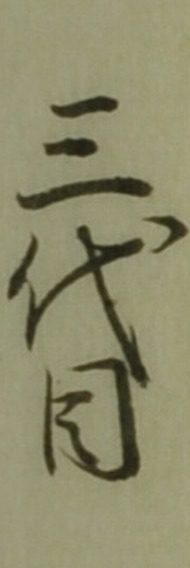三代目
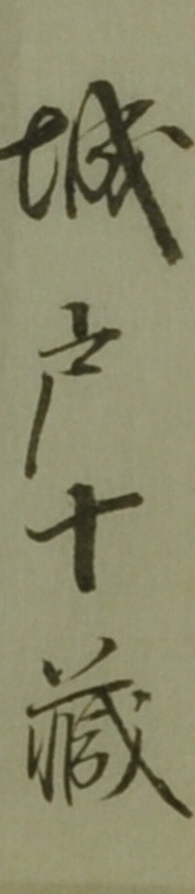城戸十蔵
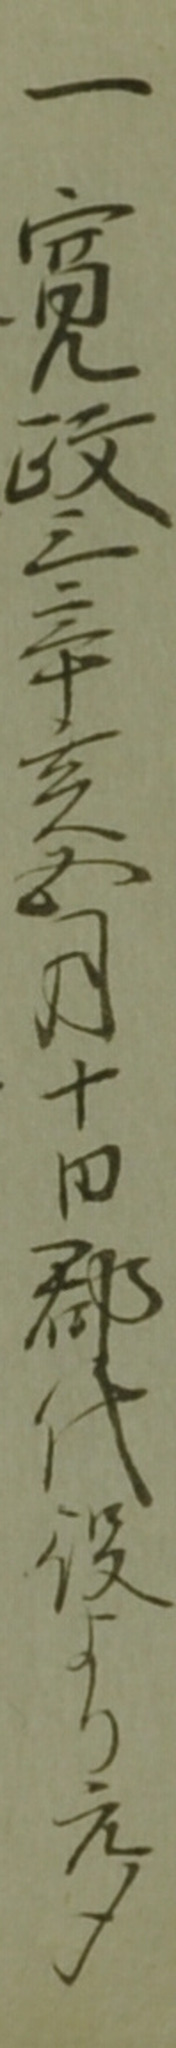一寛政三辛亥五月十日郡代役より元〆
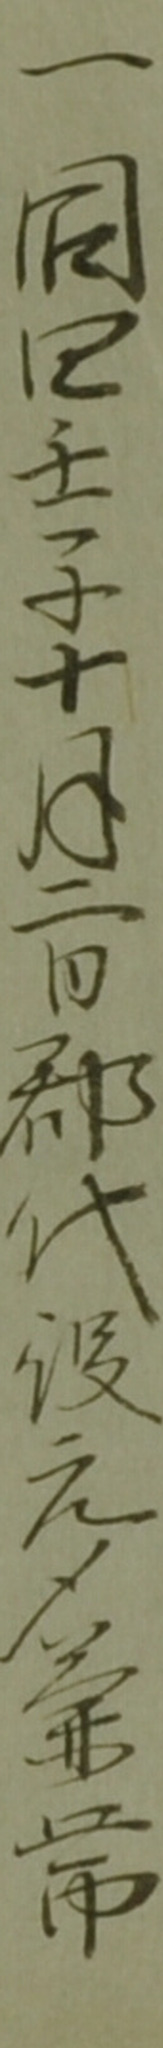一同四壬子十月二日郡代役元〆兼帯
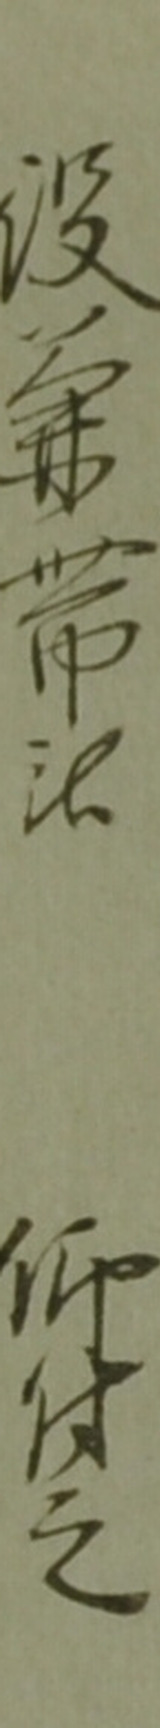役兼帯被仰付之
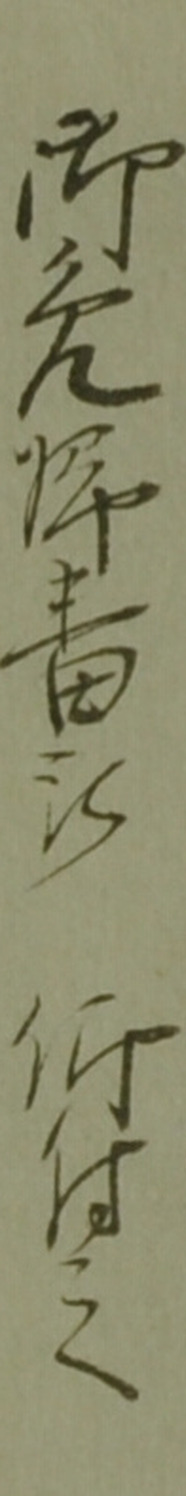御免帰番被仰付之
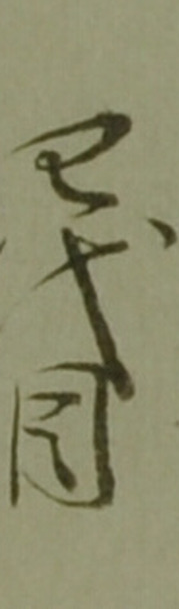四代目
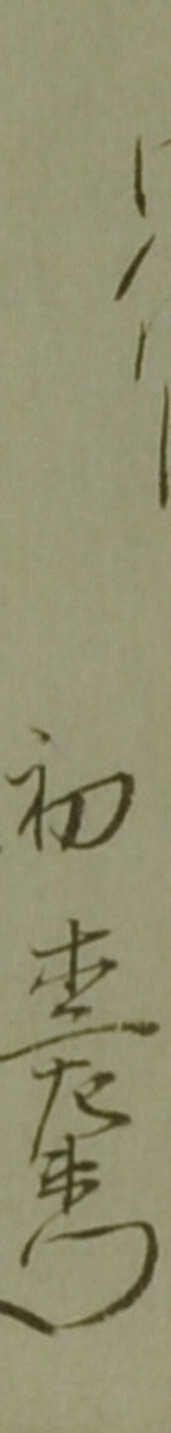初杢左衛門
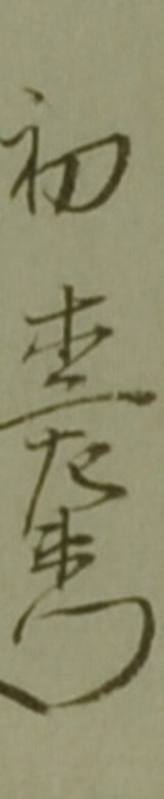初杢左衛門
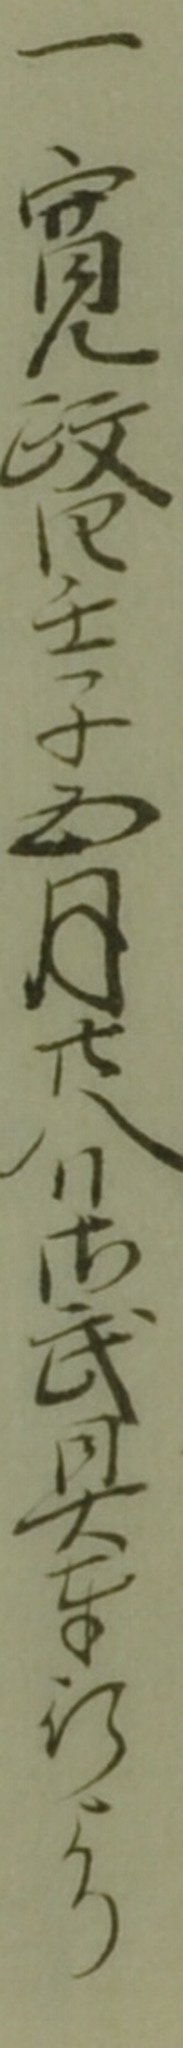一寛政四壬子五月廿八日御武具奉行より
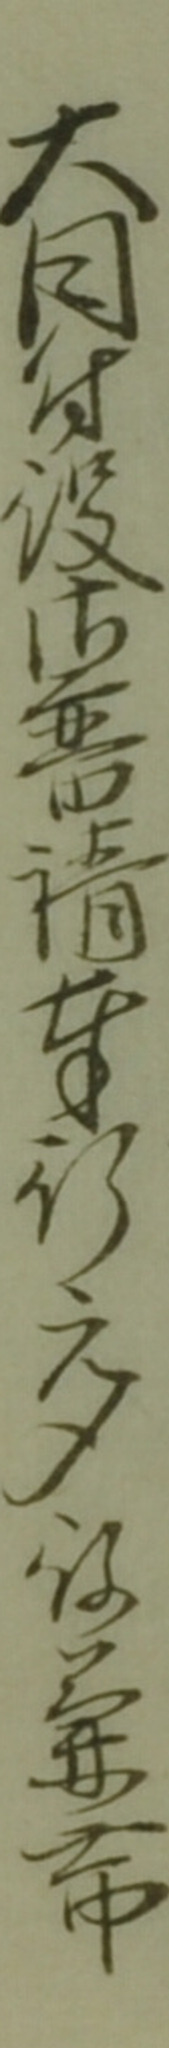大目付役御普請奉行元〆役兼帯
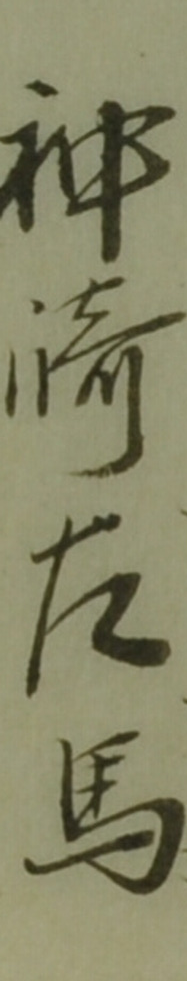神崎左馬
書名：諸御役代々録（七）
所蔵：伊那市立高遠町図書館・合同会社AMANE
